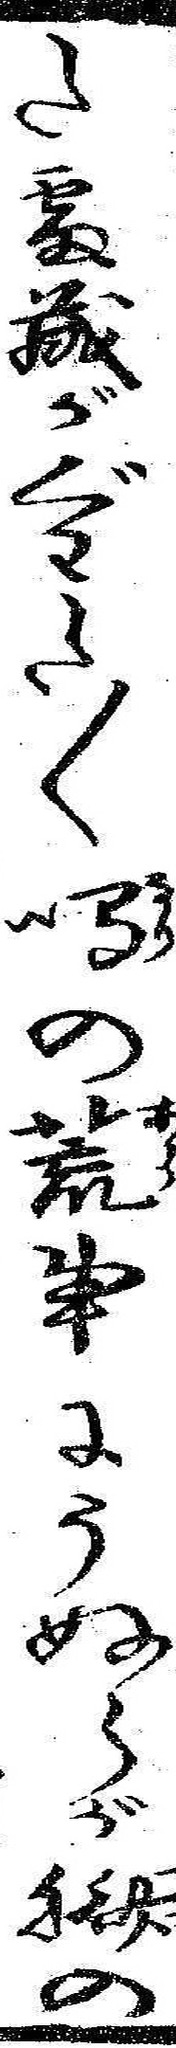た雷蔵がぐわた〱鳴の荒事にうぬらが臍の
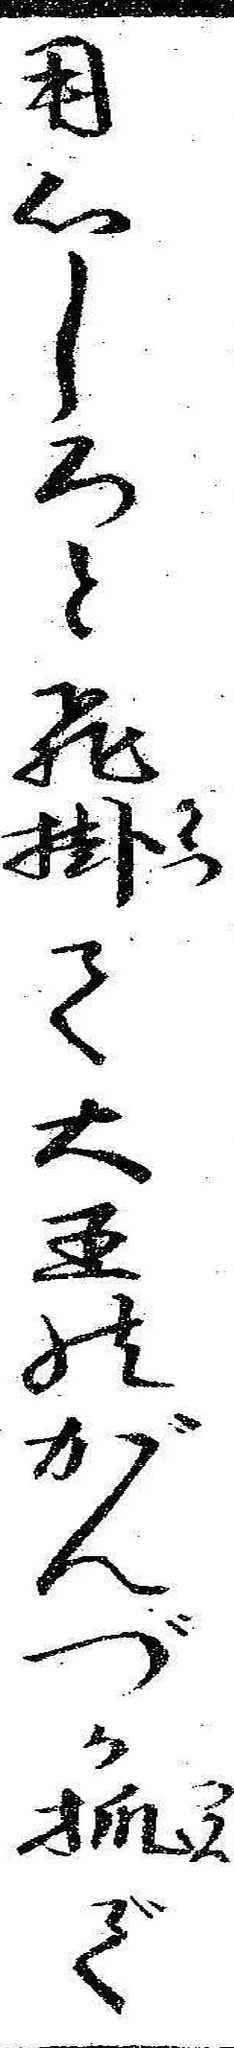用心しろと飛掛て大王のがんづか抓で
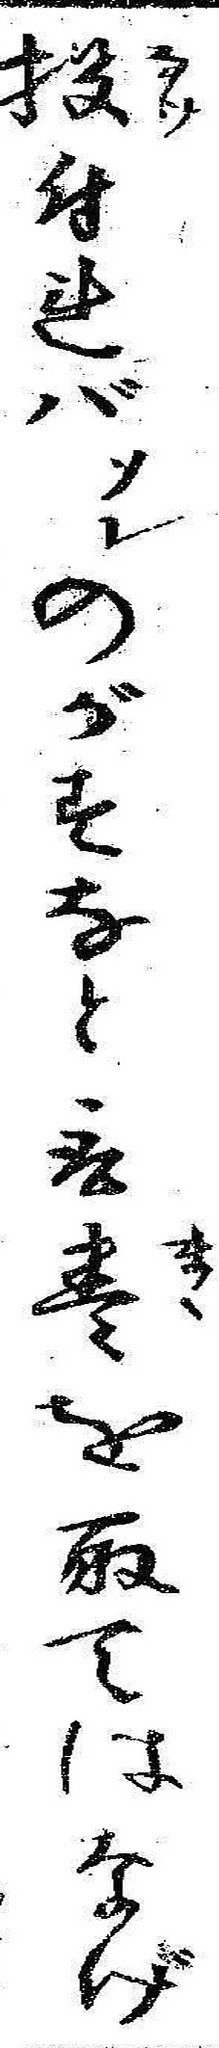投付れば取巻を取てはなげ
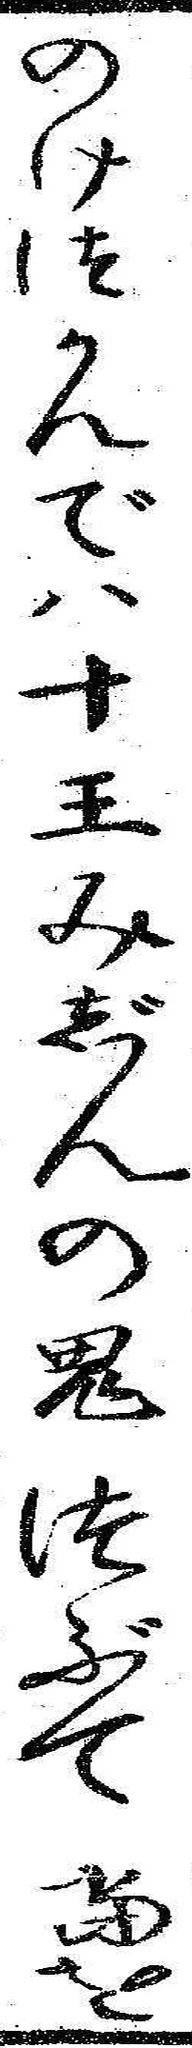のけつかんでは十王みじんの鬼つぶて当を
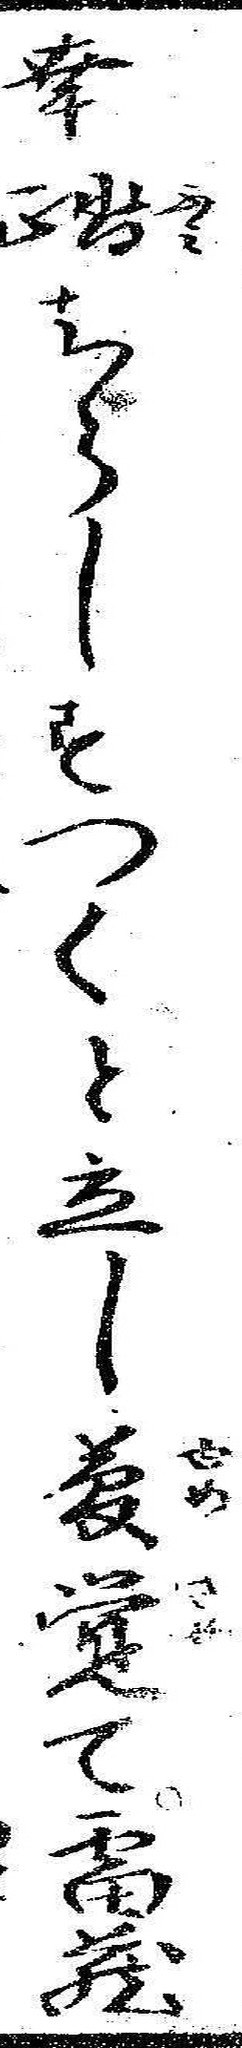幸踏ちらしすつくと立し夢覚て雷蔵
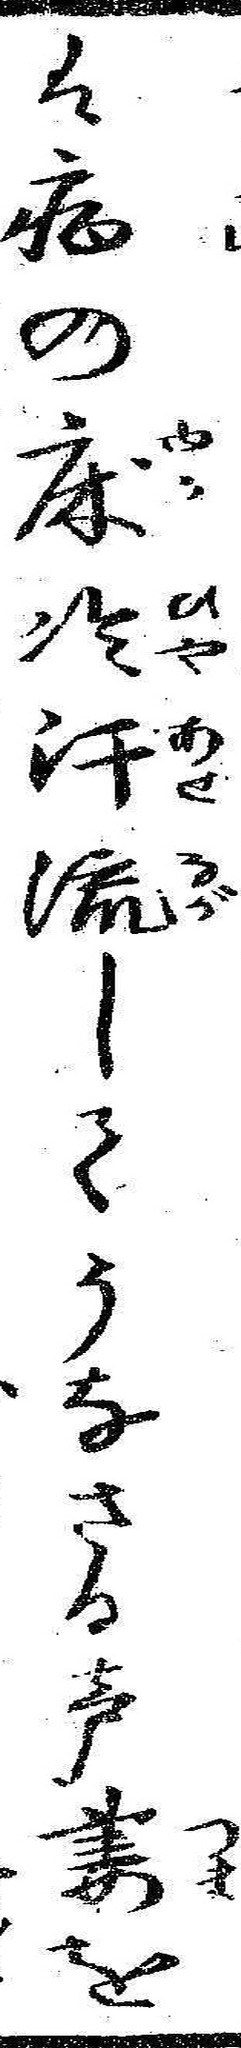は病の床冷汗流してうなさる声妻を
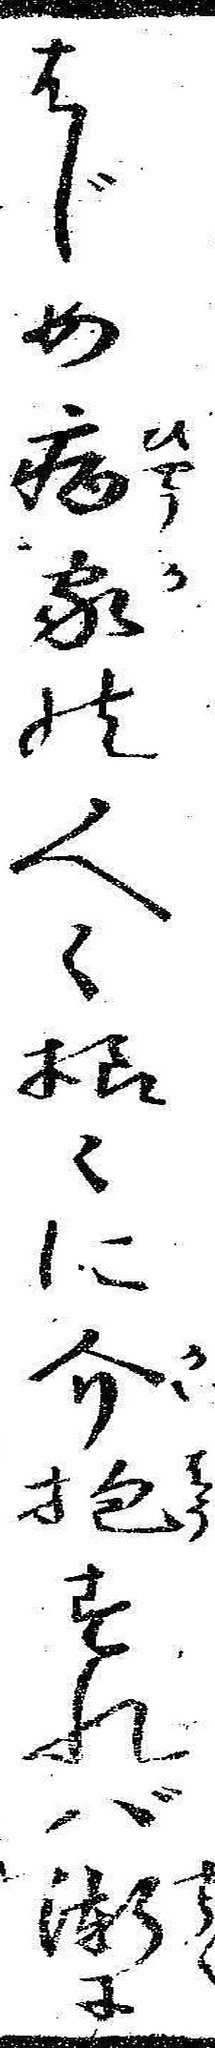はじめ病家の人々様々に今抱すれば漸に
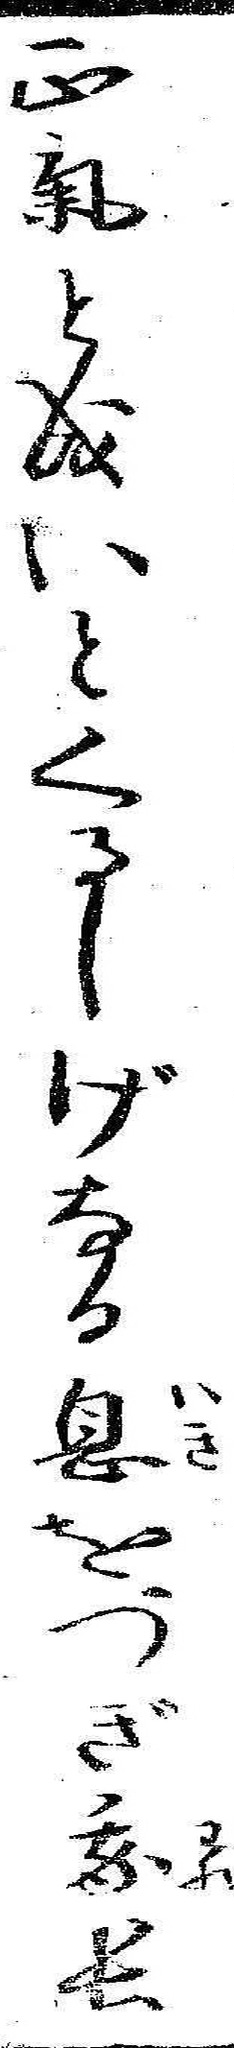正気と成いとくるしげなる息をつぎ我長
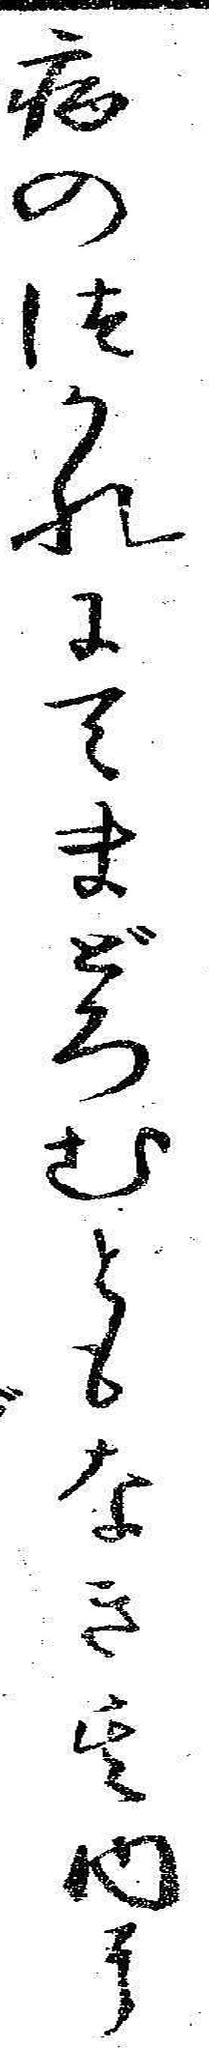病のつかれにてまどろむともなき其内に
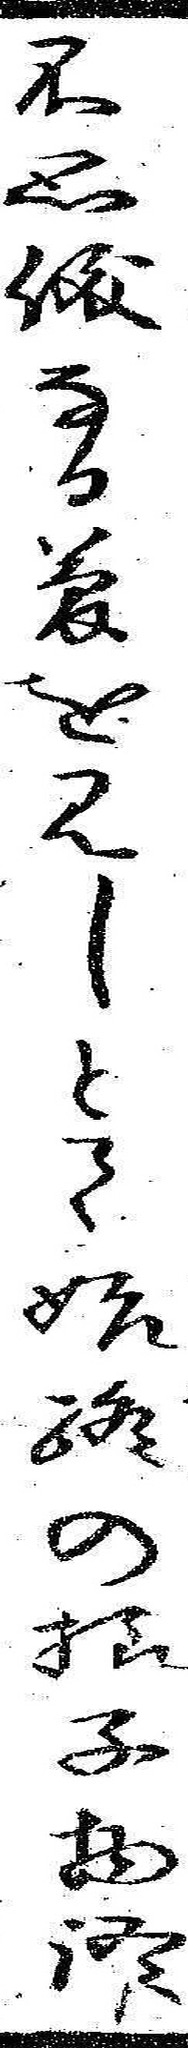不思儀なる夢を見しとて始終の様子物語

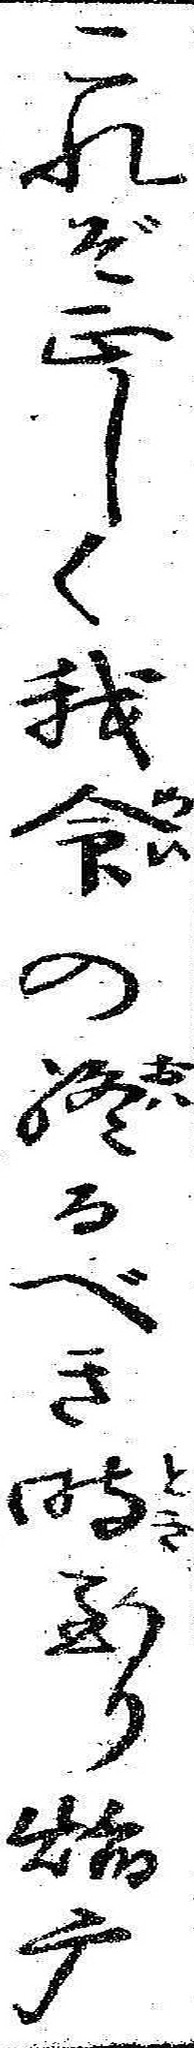これぞ正しく我命の終るべき時至り焔魔
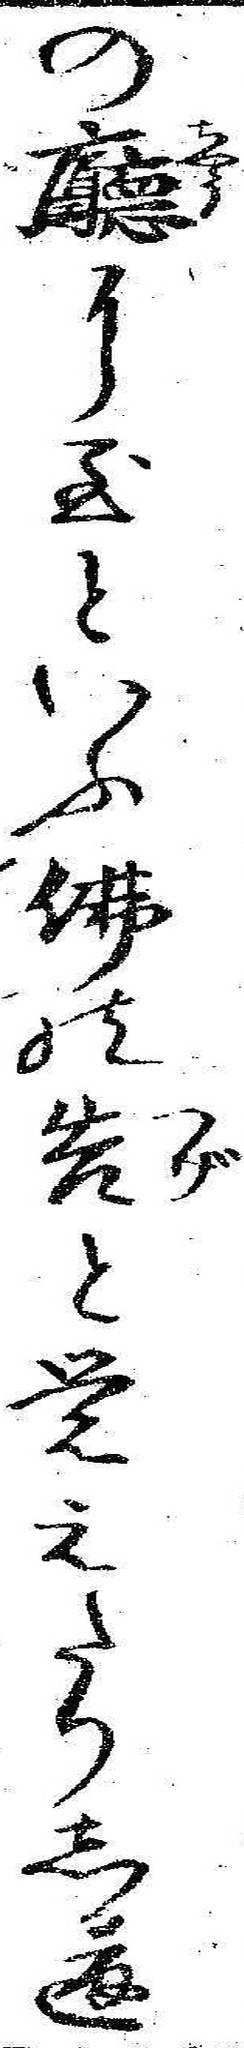の庁に至といふ仏の告と覚えたりしる通
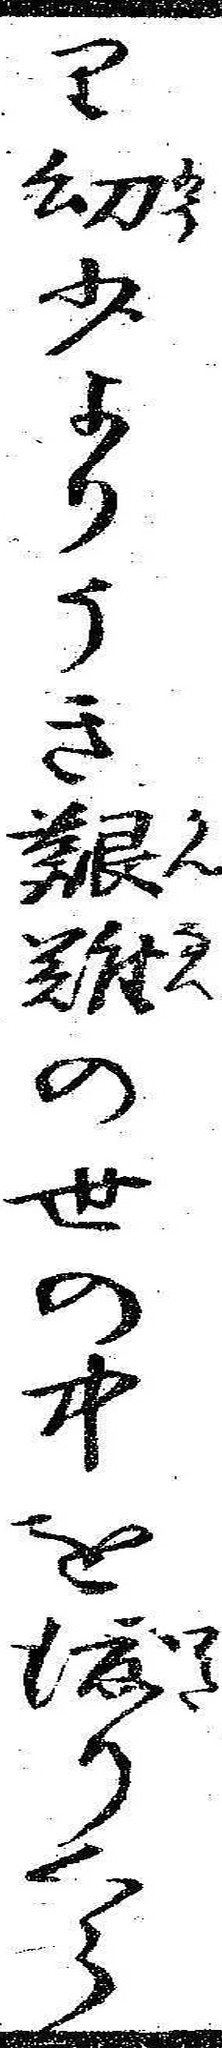り幼少よりうき艱難の世の中を渡りくら
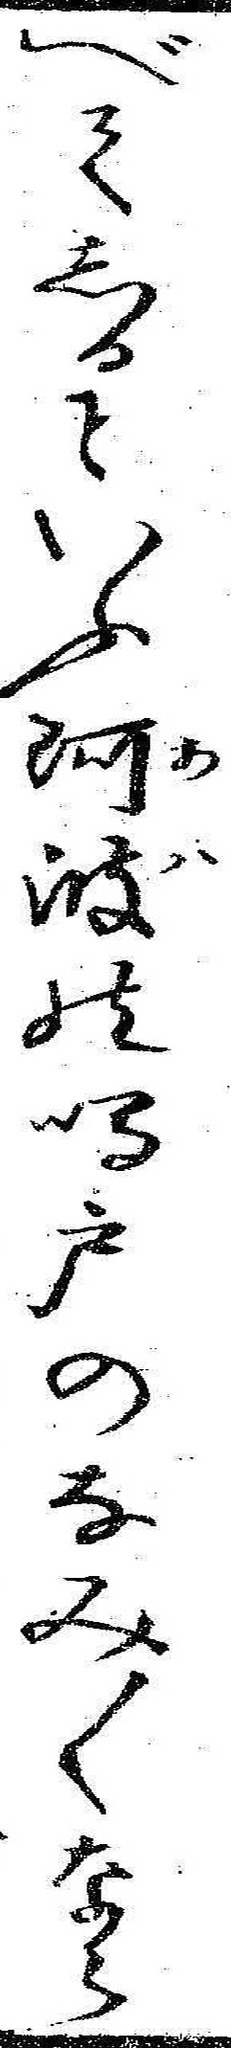べてしるといふ河波の鳴戸のなみ〱なら
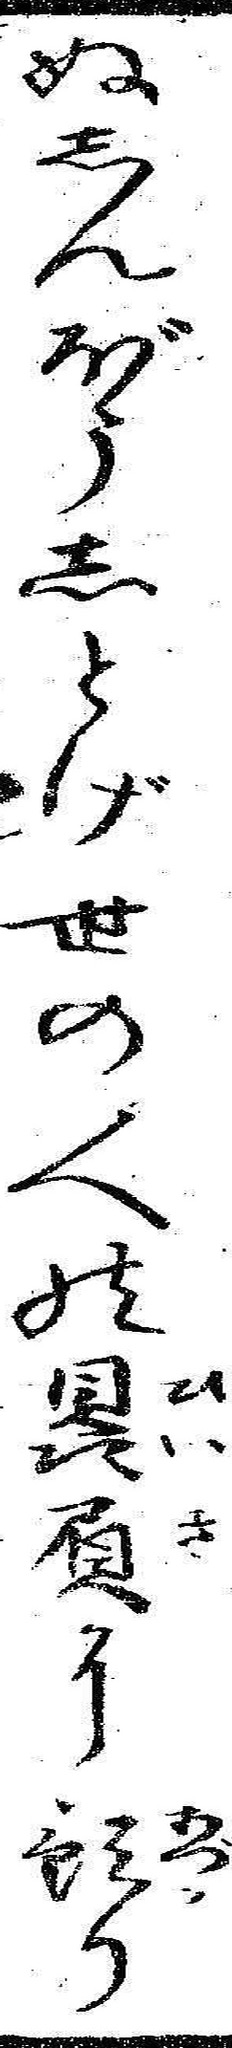ぬしんぼうしとげ世の人の贔屓に預り
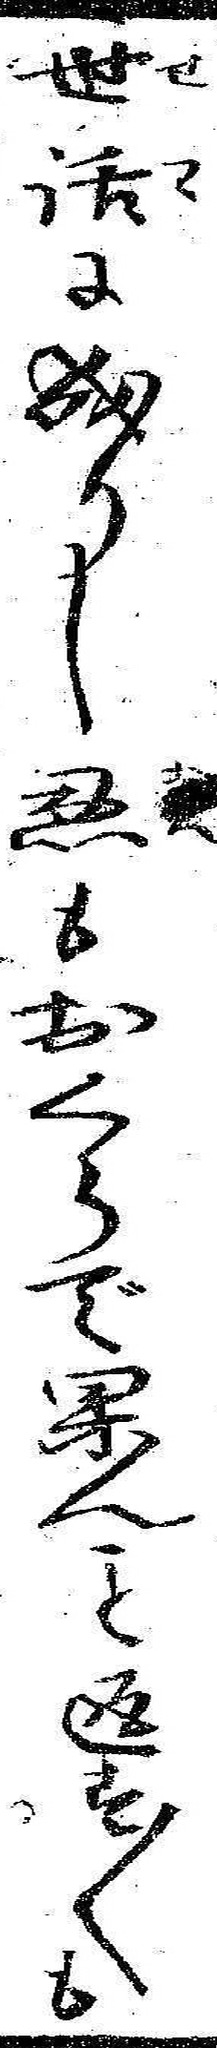世話に成りし恩もおくらで果んこと返す〱も
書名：根無草後編
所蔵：国文学研究資料館
